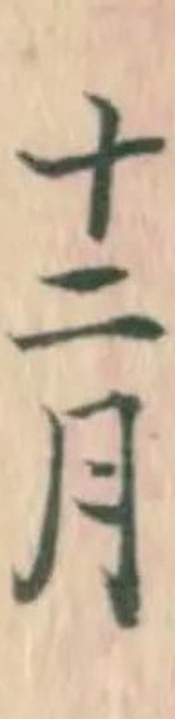十二月
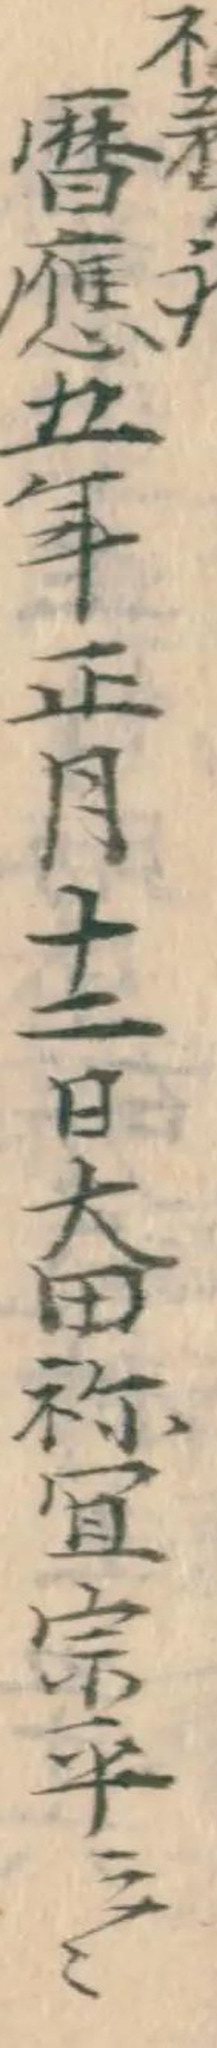宗平暦応五年正月十二日大田祢宜宗平云々
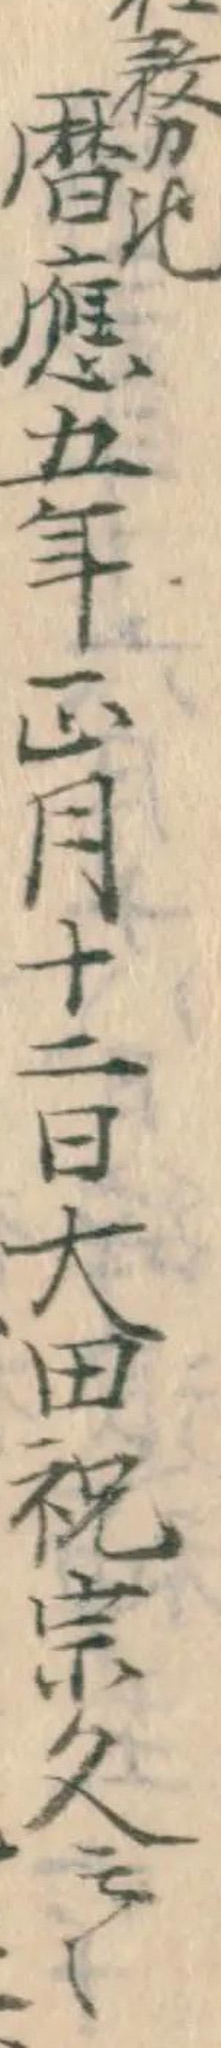暦応五年正月十二日大田祝宗久云々
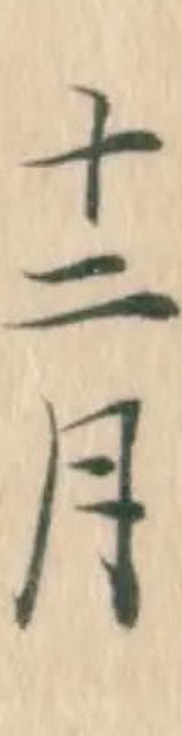十二月
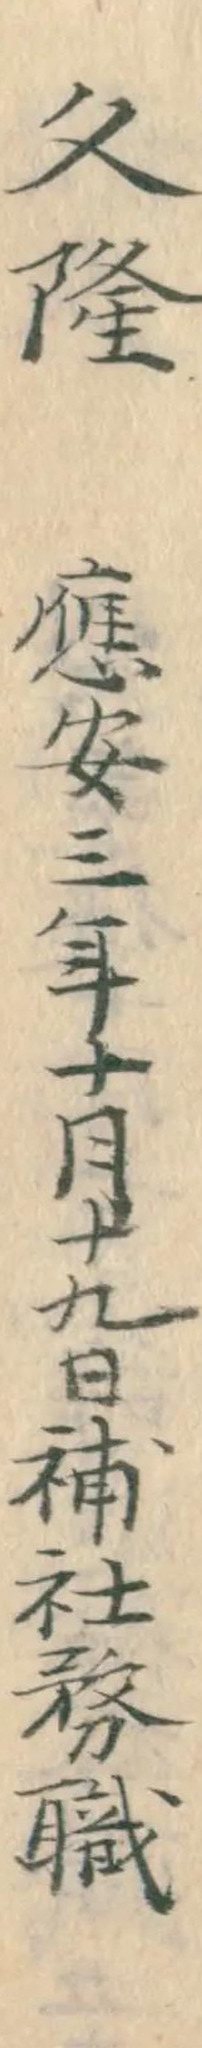久隆応安三年十月十九日補社務職
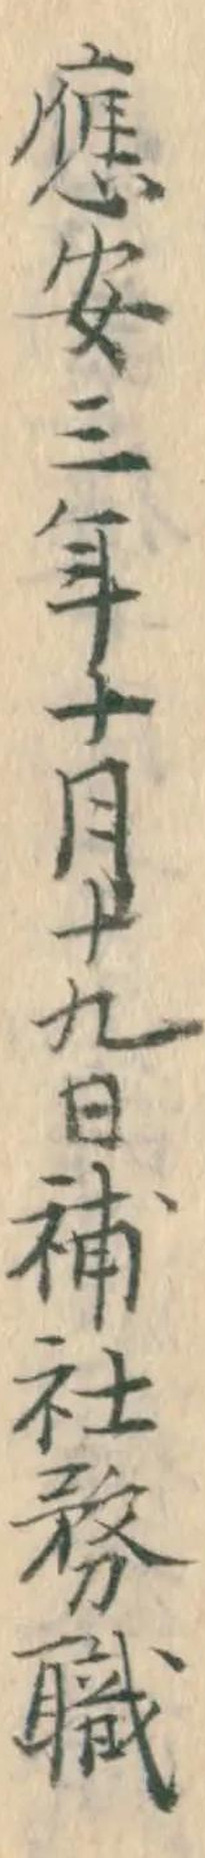久隆応安三年十月十九日補社務職

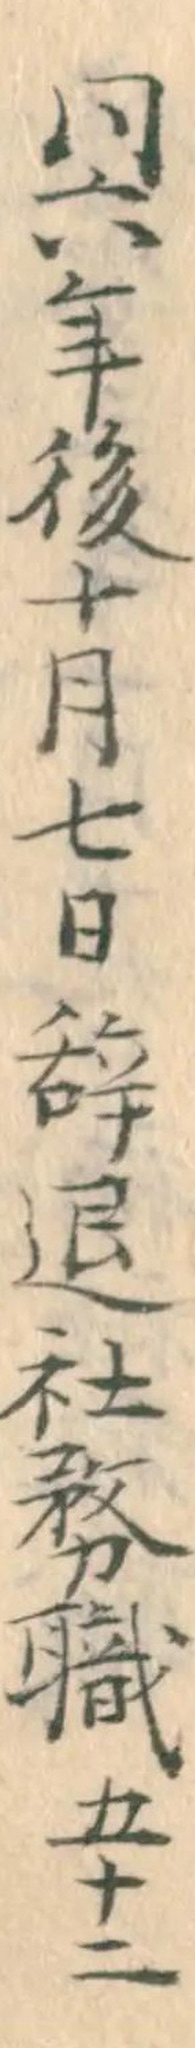同六年後十月七日辞退社務職五十二
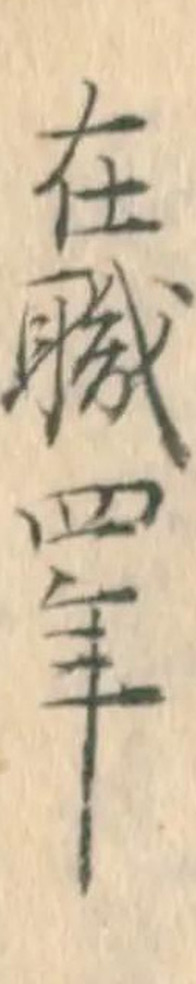在職四年
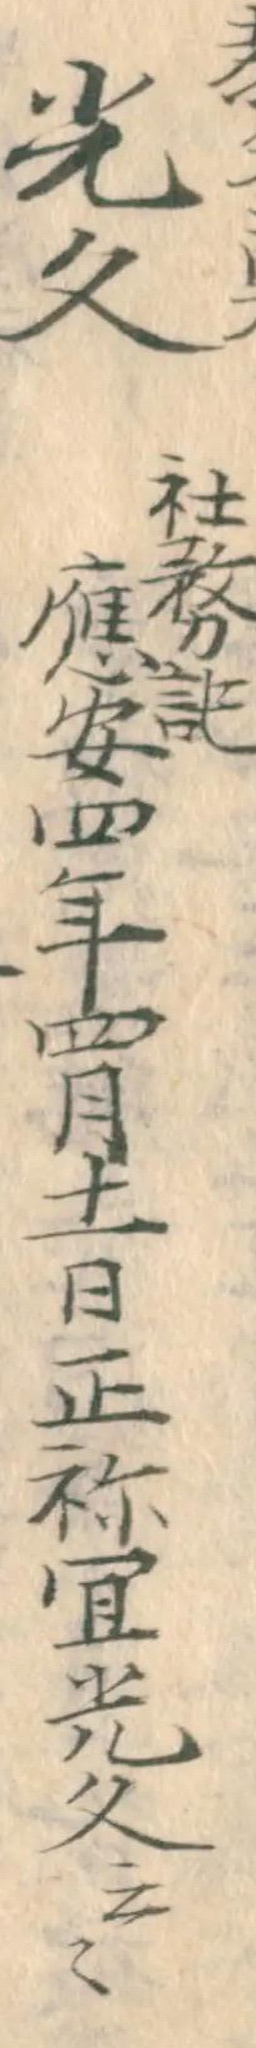光久応安四年四月十一日正祢宜光久云々
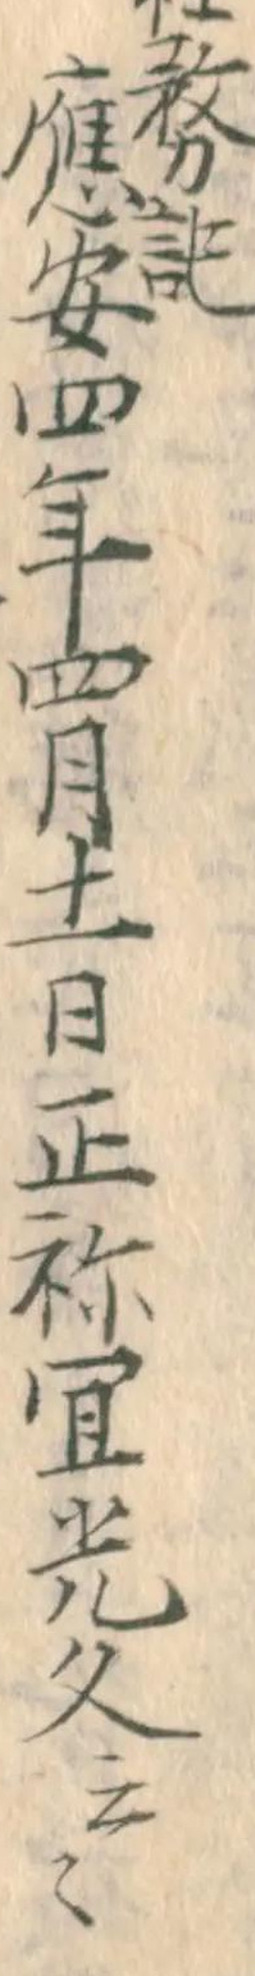光久応安四年四月十一日正祢宜光久云々
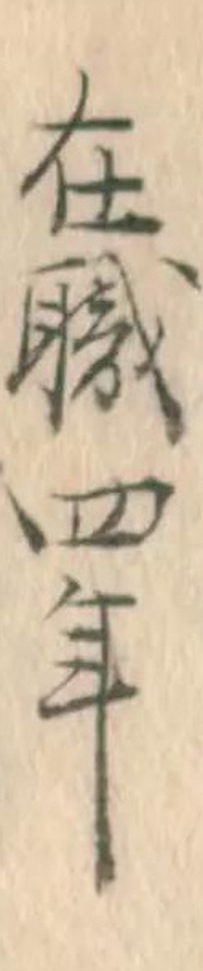在職四年
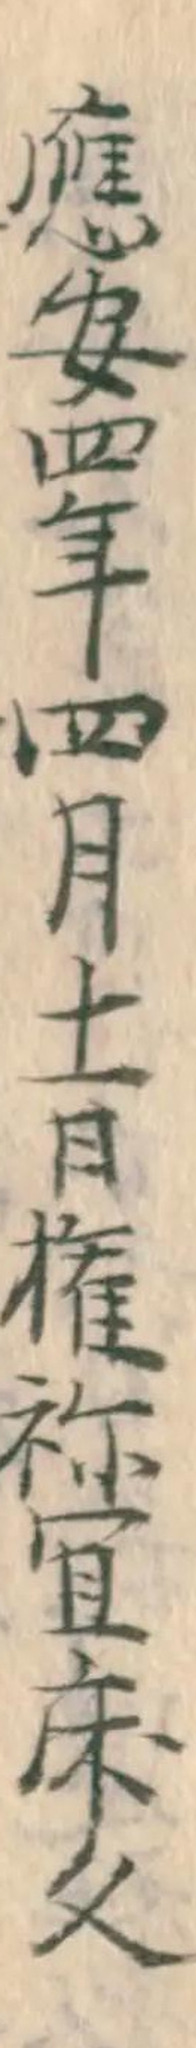床久応安四年四月十一日権祢宜床久
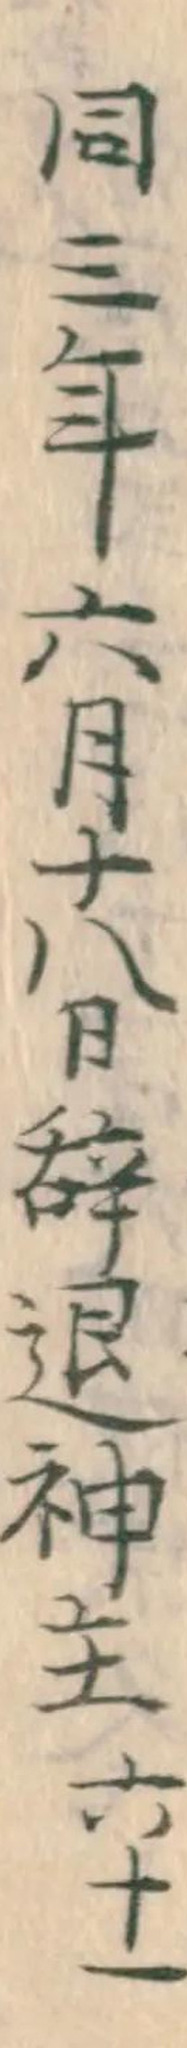同三年六月十八日辞退神主六十一
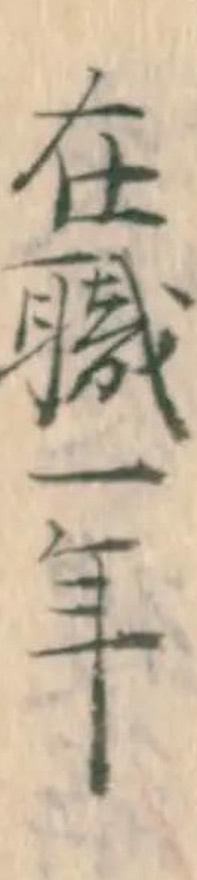在職一年
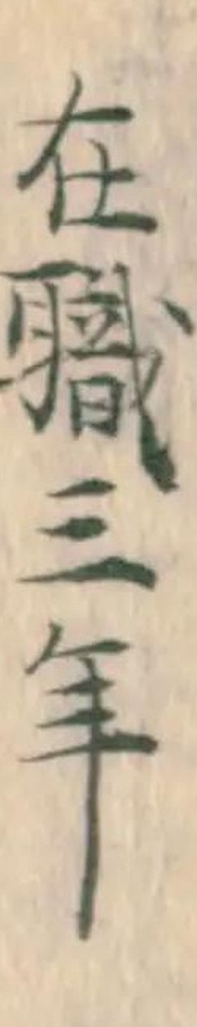在職四年
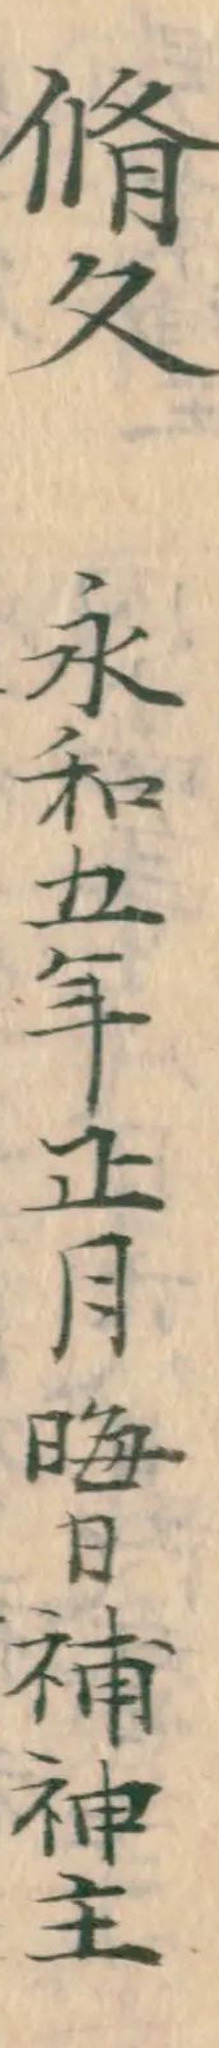修久永和五年正月晦日補神主
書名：賀茂社記録. 第23冊
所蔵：国立国会図書館 National Diet Library, JAPAN
